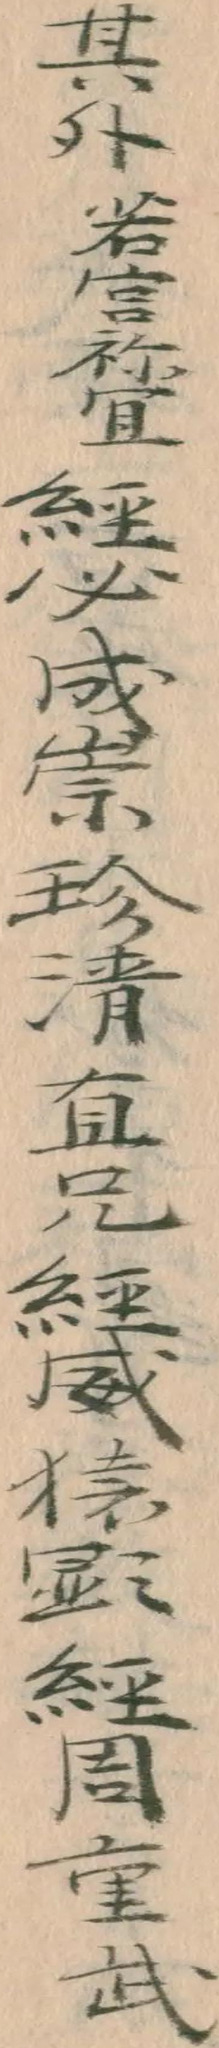其外若宮祢宜経必成崇珍清直兄経威猿顕経周重武
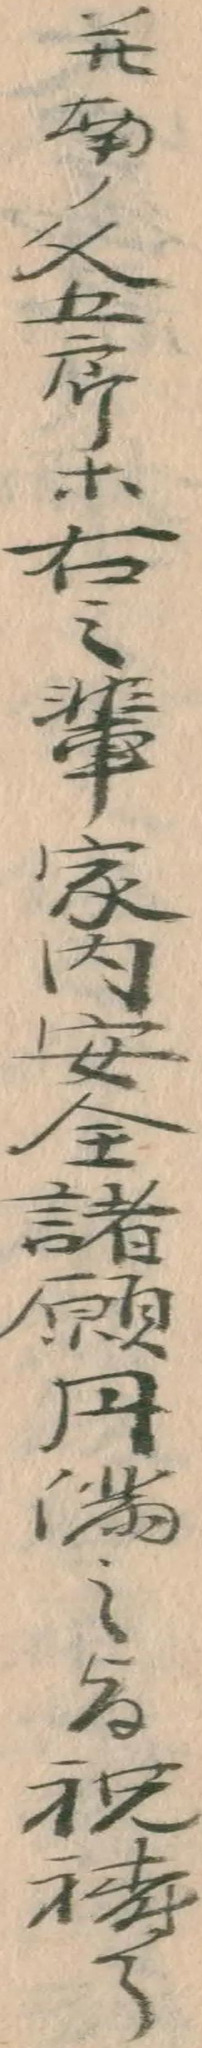并南ノ文五郎等右之輩家内安全諸願円満之旨祝祷了
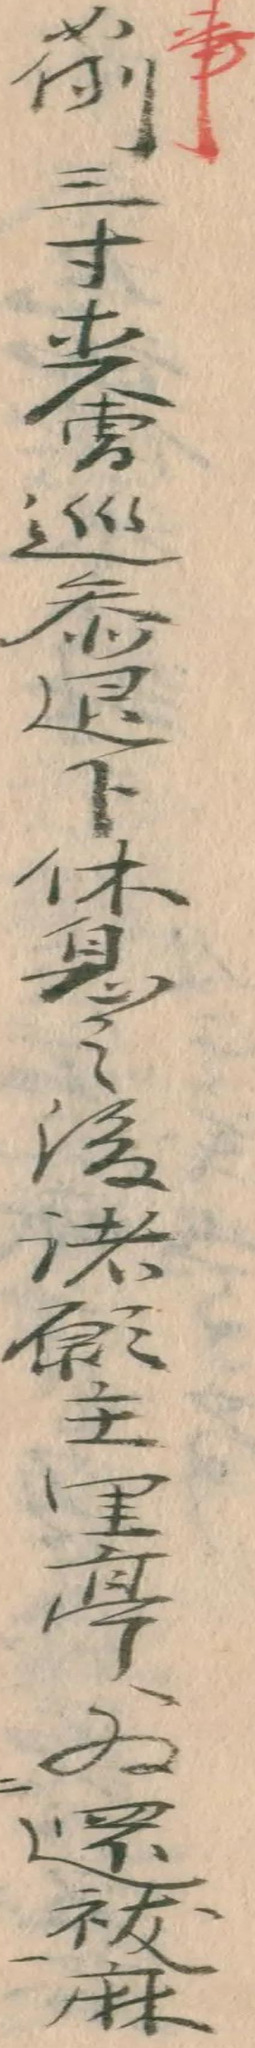如例三寸直會巡参退下休息之後諸願主里亭へ為還祓麻
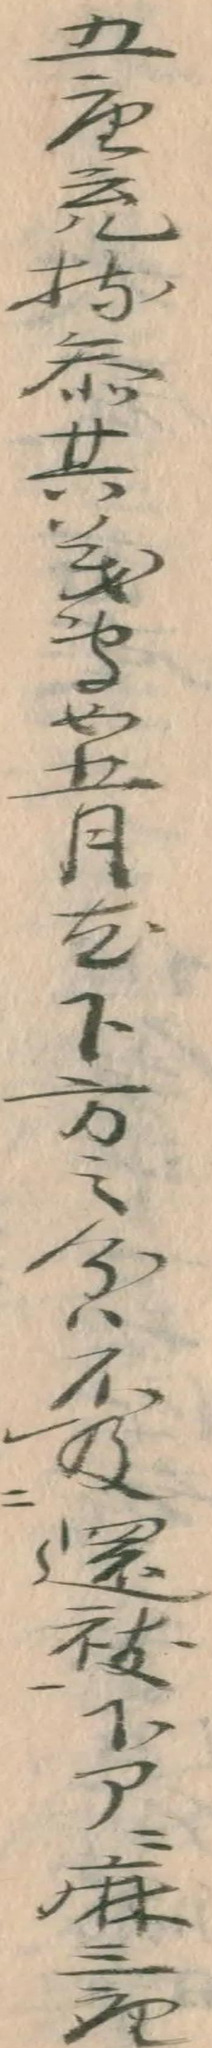五座充持参其義専如五月尤下方之分ハ不及還祓下部ニ麻三座
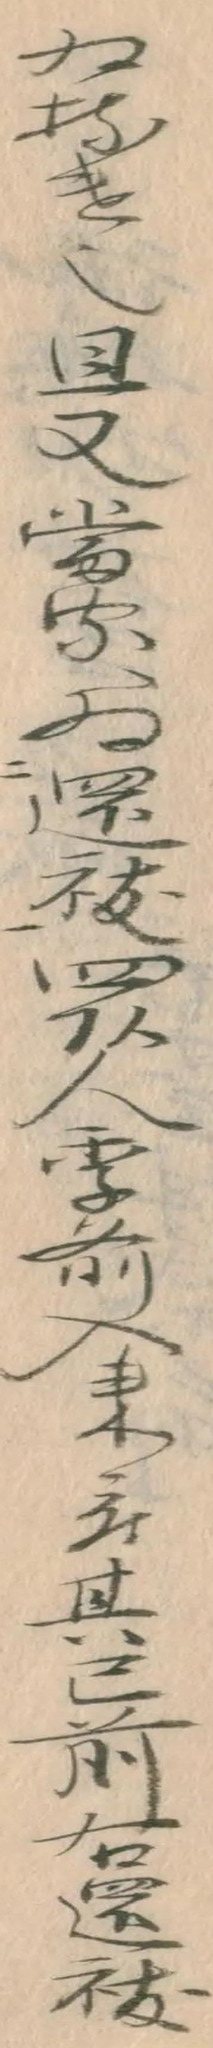為持遣也且又當家へ為還祓四頭人季前入来ニ付其已前右還祓
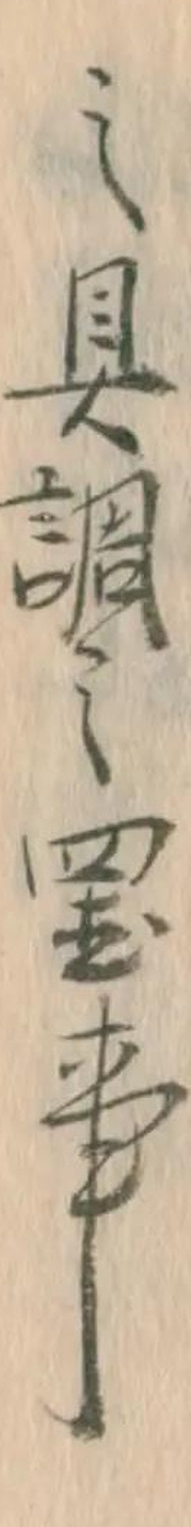之具調之置事
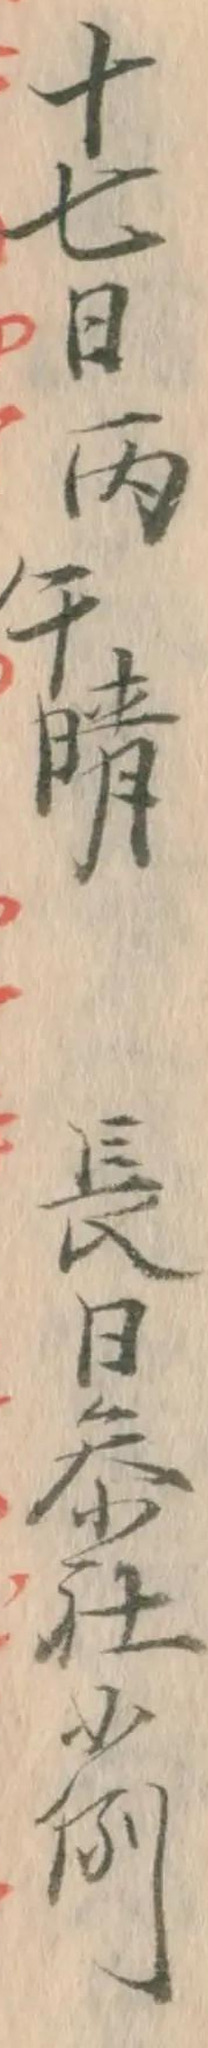十七日丙午晴長日参社如例
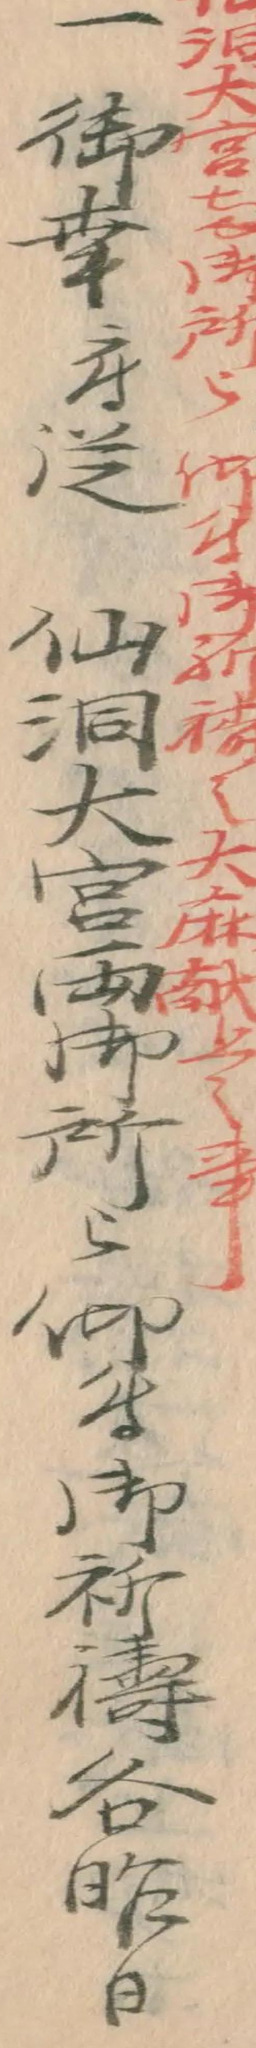一御幸に付従仙洞大宮両御所被仰付御祈祷各昨日

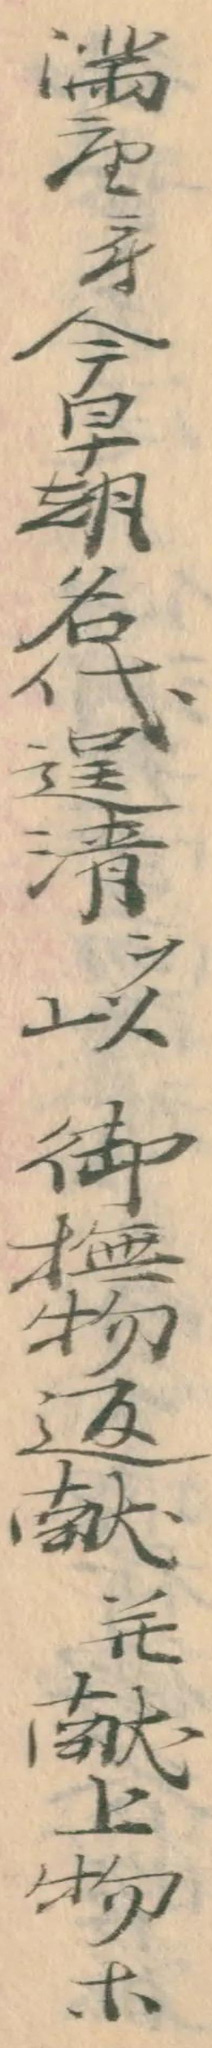満座ニ付今早朝名代逞清ヲ以御撫物返献并献上物等
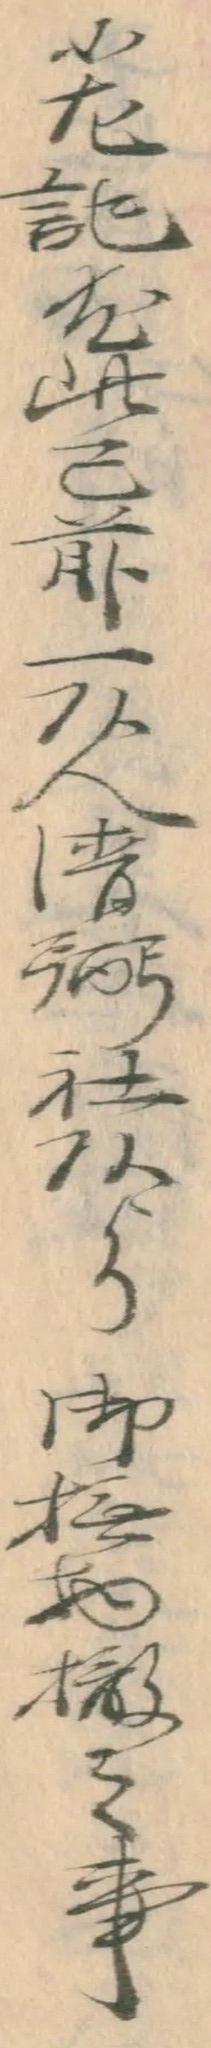如左記尤此已前一頭人清弼社頭より御撫物撒之事
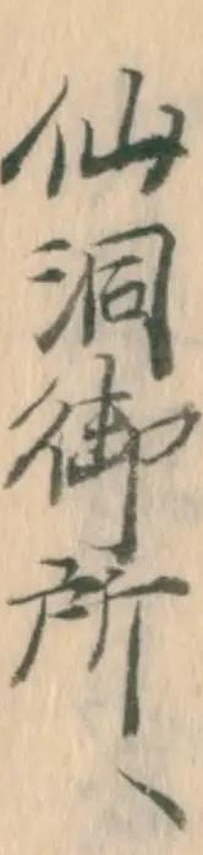仙洞御所へ
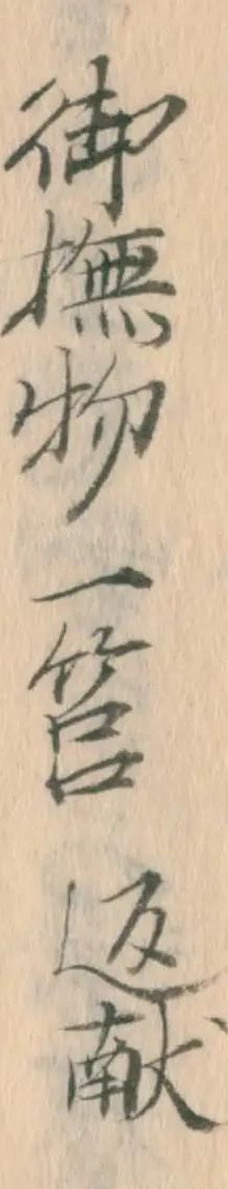御撫物一筥返献
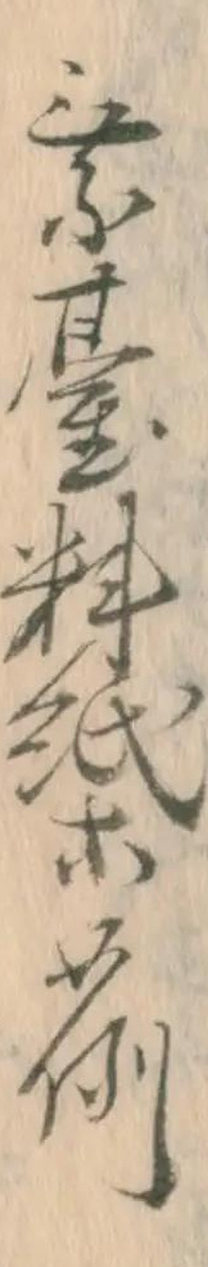乗臺料紙等如例
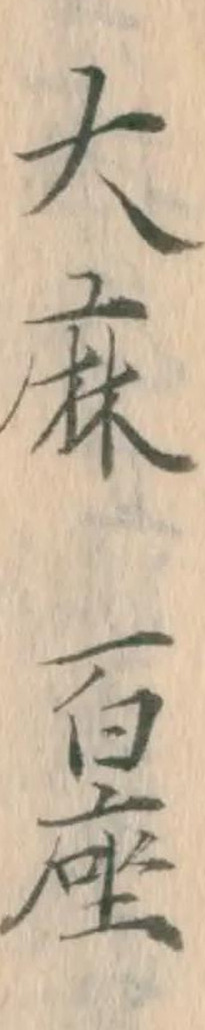大麻百座
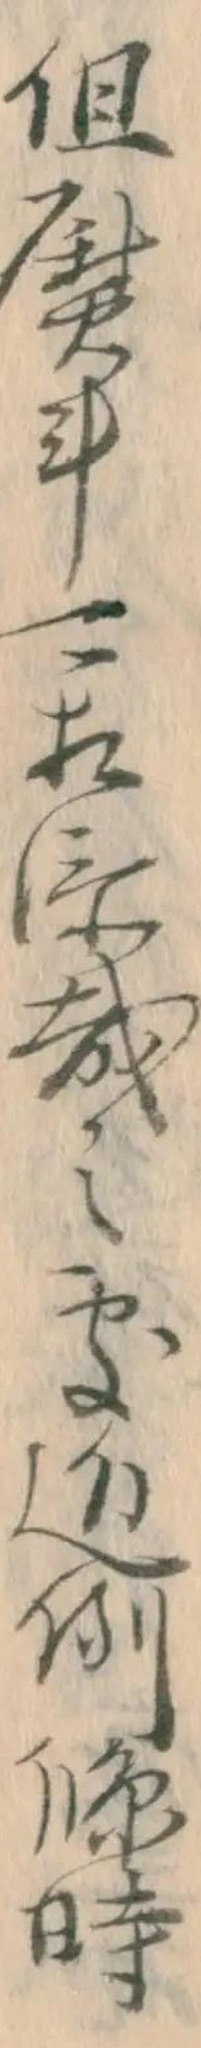但熨斗可相添哉之處近例臨時
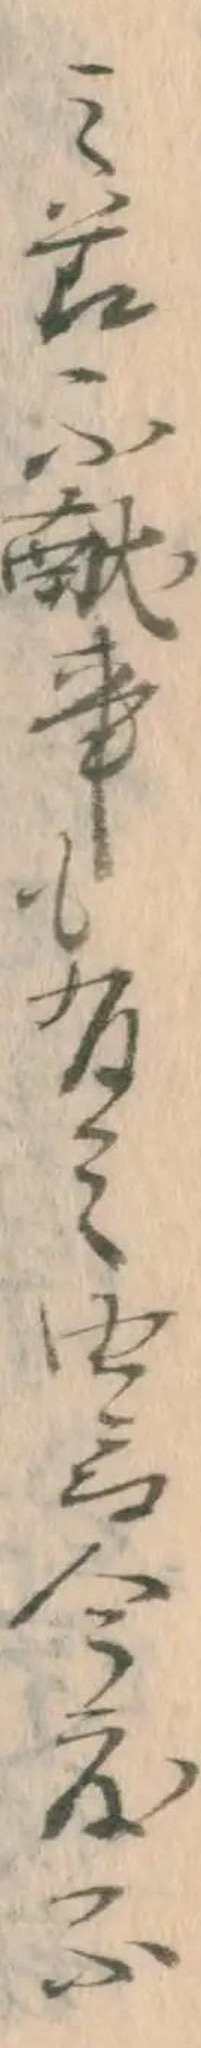之節不献事も有之由ニ而今度不
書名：賀茂社記録. 第74冊
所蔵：国立国会図書館 National Diet Library, JAPAN
